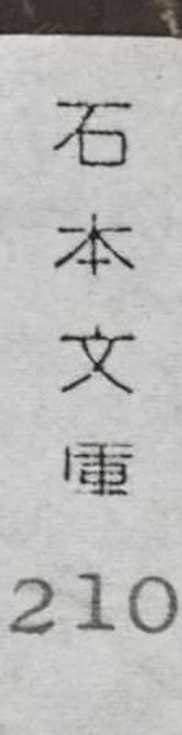石本文庫
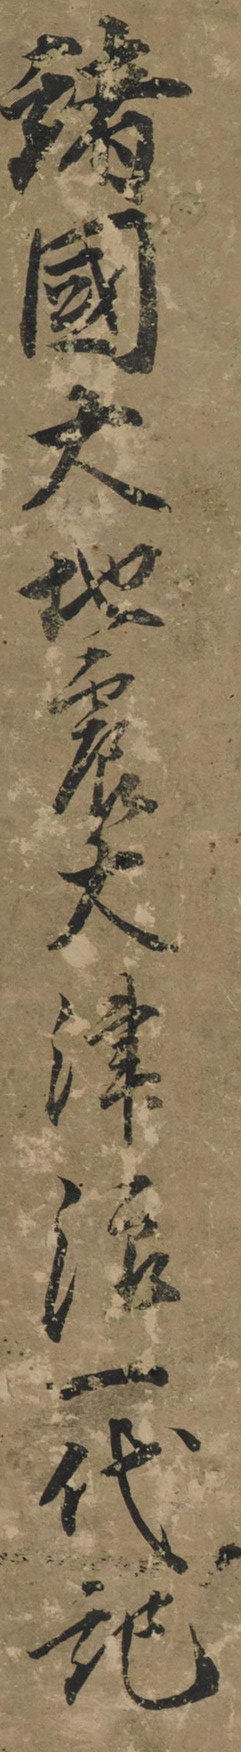諸国大地震大津浪一代記

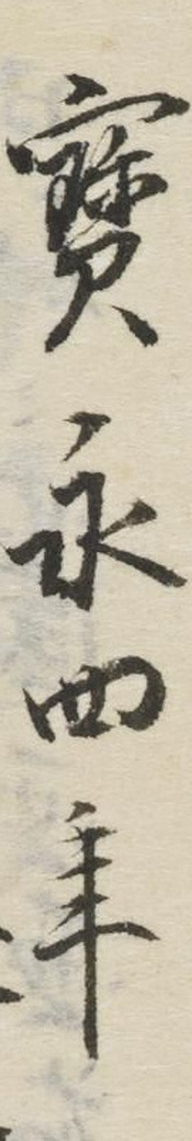宝永四年
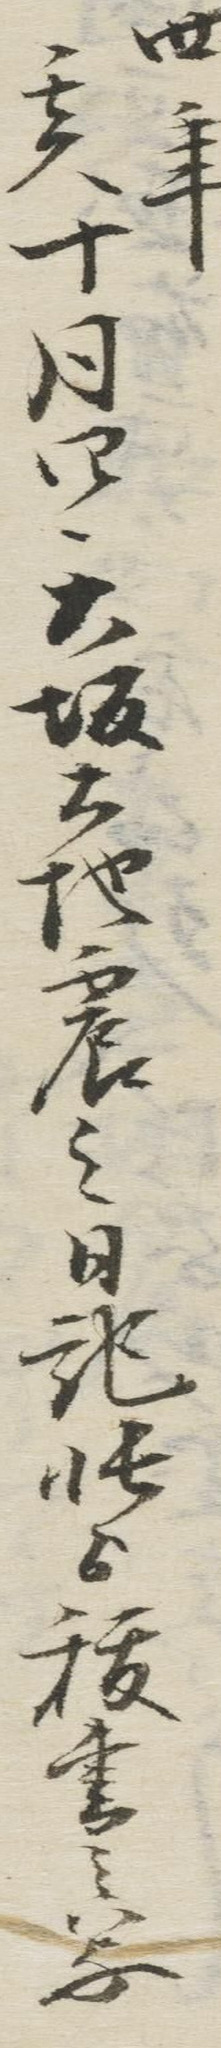亥十月四日大坂大地震之日記帳ゟ抜書之写
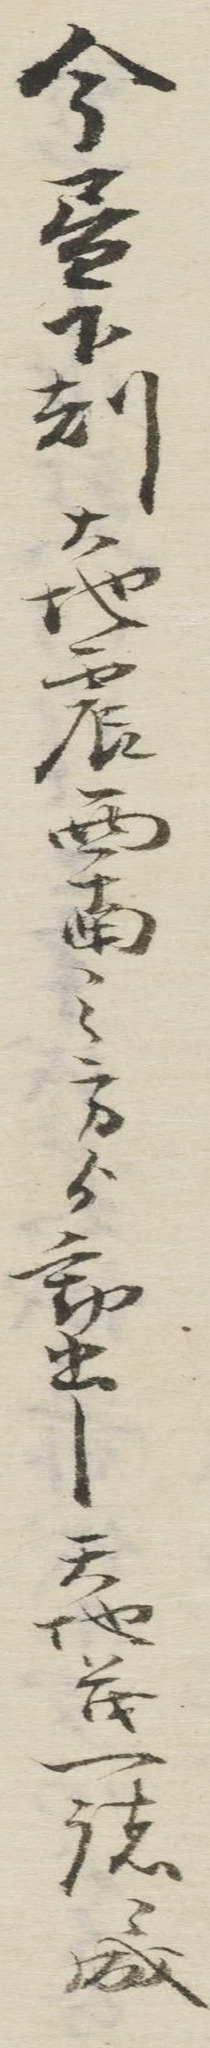今昼下刻大地震西南之方ゟ動出し天地茂一緒ニ成
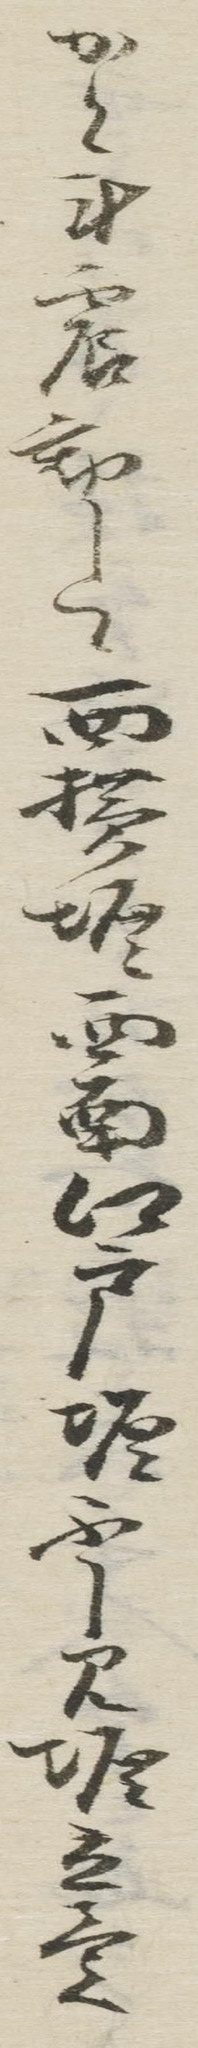かと斗震動して西横堀西南江戸堀ふし見堀立売
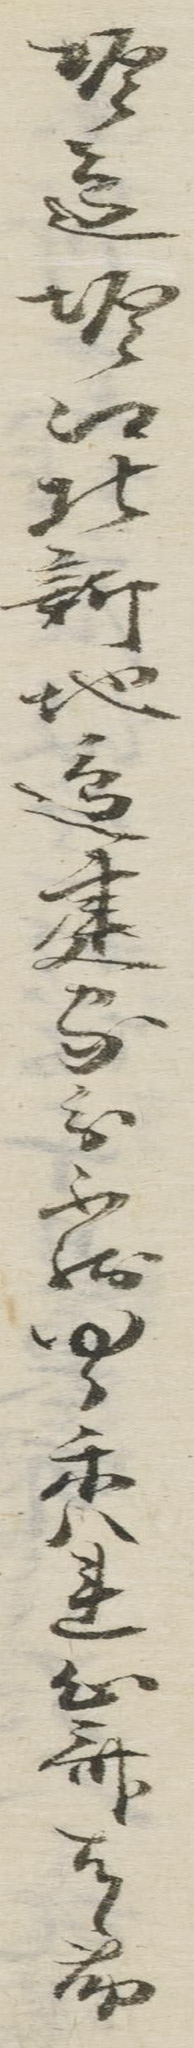堀辺堀江北新地辺建家分不残ゆり禿れ心斎はし筋
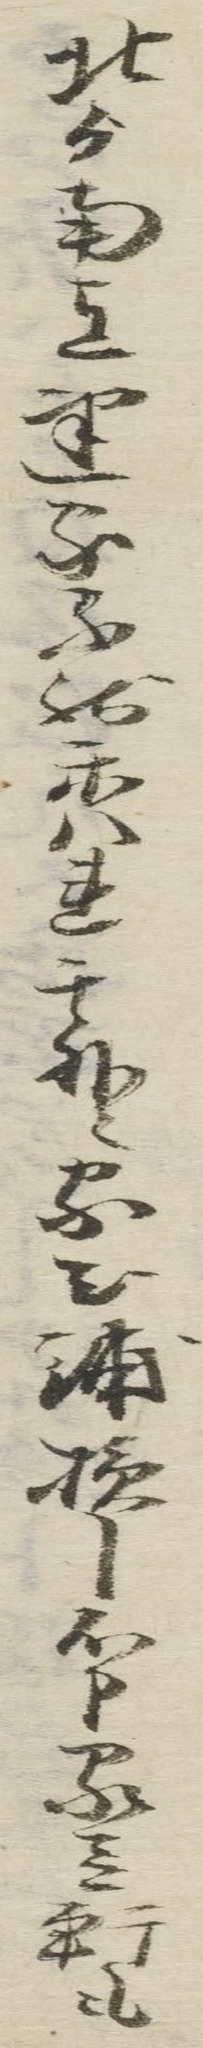北ゟ南迄建家不残禿れ其外ニ家屋敷損し不申家壱軒も
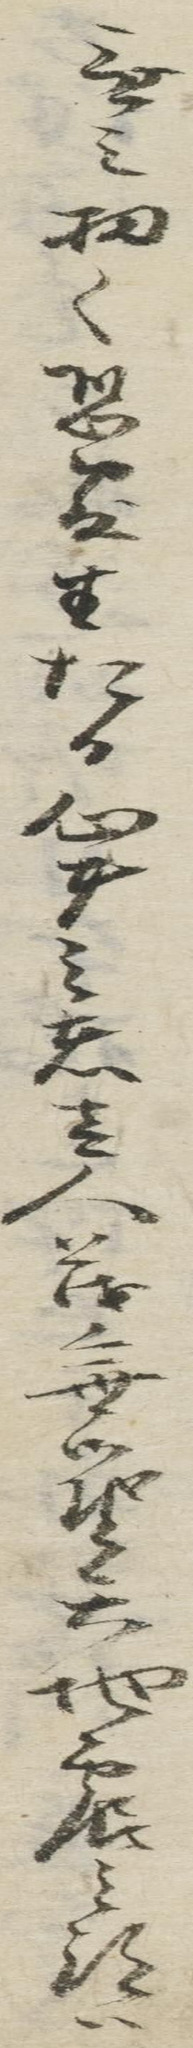無之扨〱恐敷生たる心中之者壱人茂無御座候大地震之類ハ

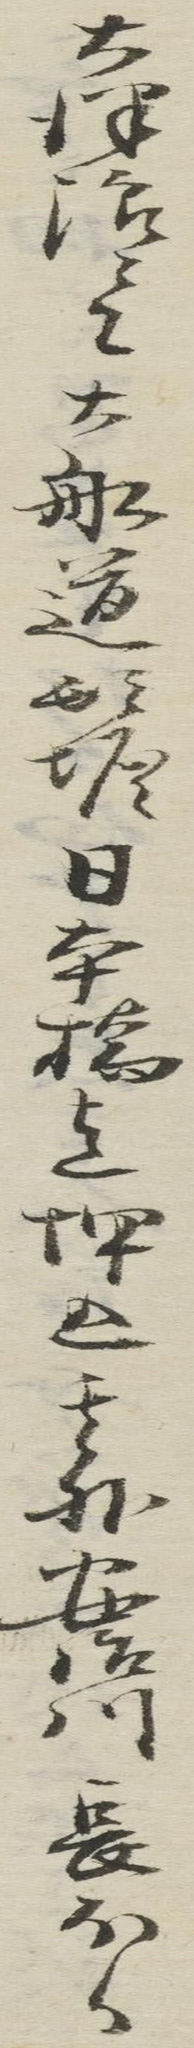大津浪ニて大船道頓堀日本橋迄押込其外安治川長ほり
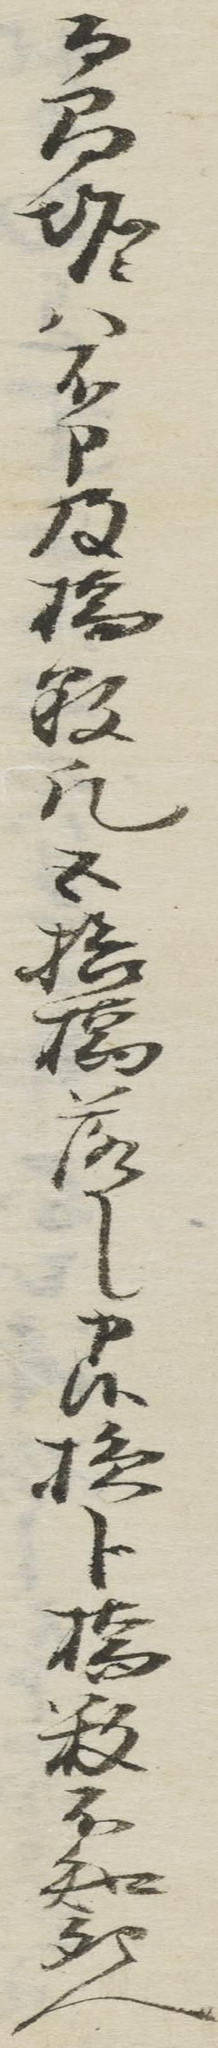百間堀は不申及橋数凡五拾橋落し申候損じ橋数不知死人
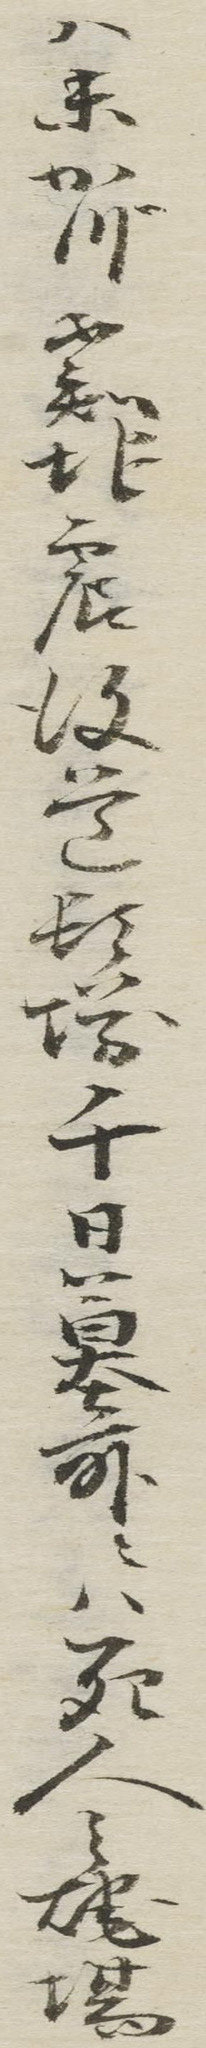は未かづ不知地震後道頓堀千日墓所ニは死人之焼場
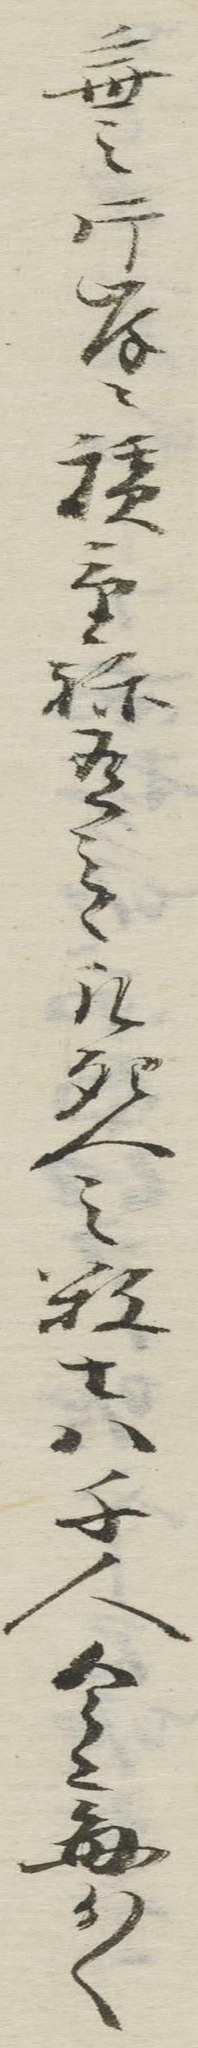無之片岸ニ積重ね有之候凡死人之数七八千人今ニ毎日〳〵
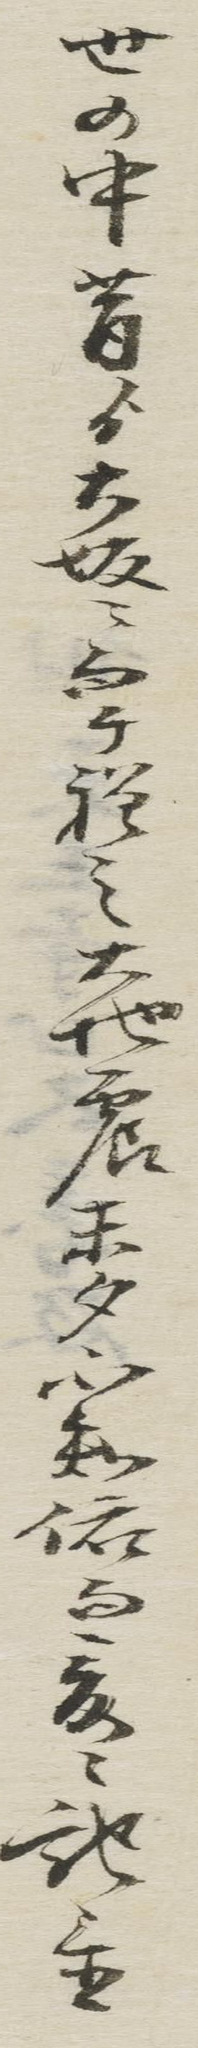世の中昔ゟ大坂ニ而ケ程之大地震未タ不知依而爰ニ記置
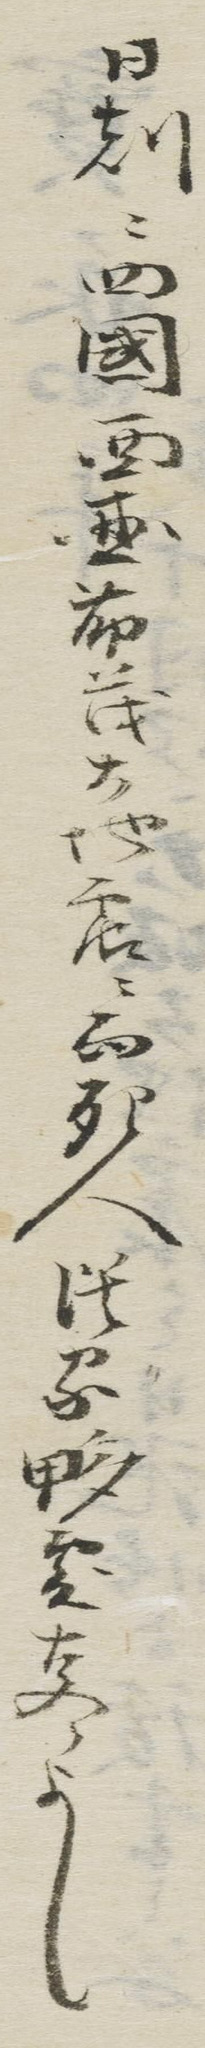日刻ニ四国西国筋茂大地震ニ而死人潰家夥敷事ノよし
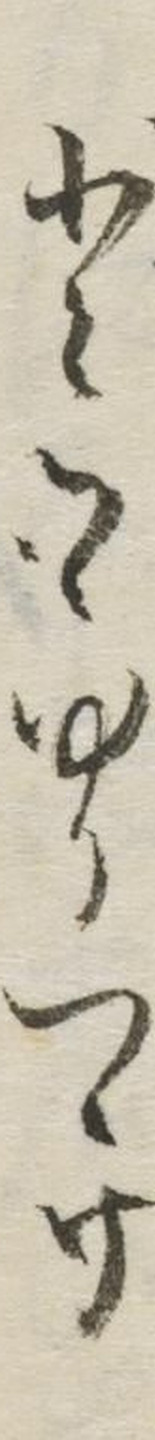少々つゝゆりつゝけ
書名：諸国大地震大津波一代記
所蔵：東京大学地震研究所図書室 Earthquake Research Institute Library, The University of Tokyo, JAPAN
